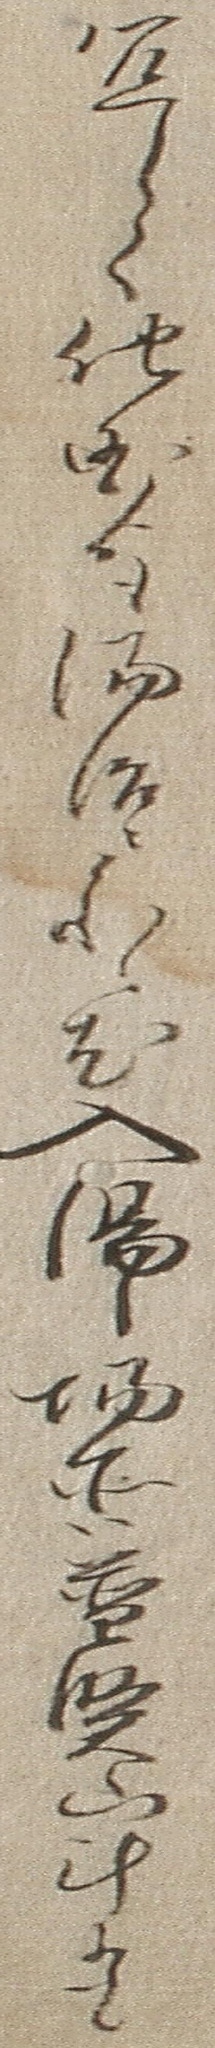宜しく他国よりも湯治に参候尤入湯之場所は普賢山斗にも
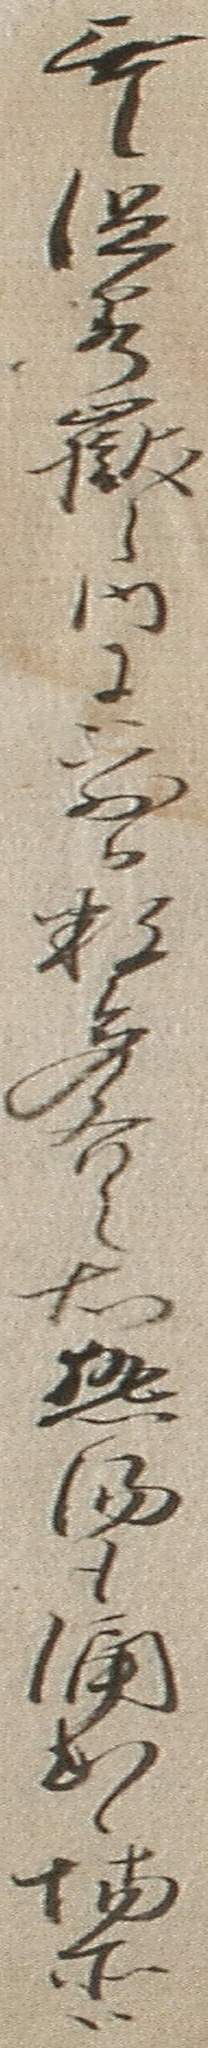無之温泉嶽之内には別而数多有之候右熱湯も涌出候場所は
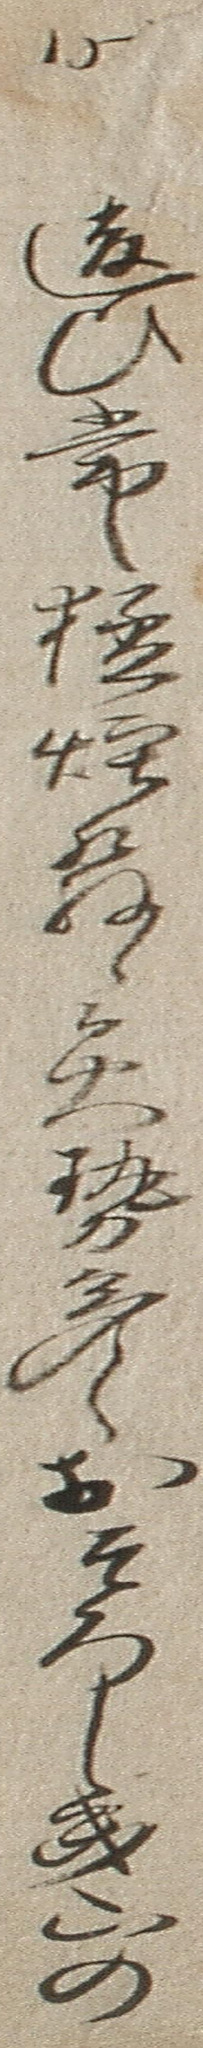違ひ常々猛煙発候而火勢多くおそろしき山の
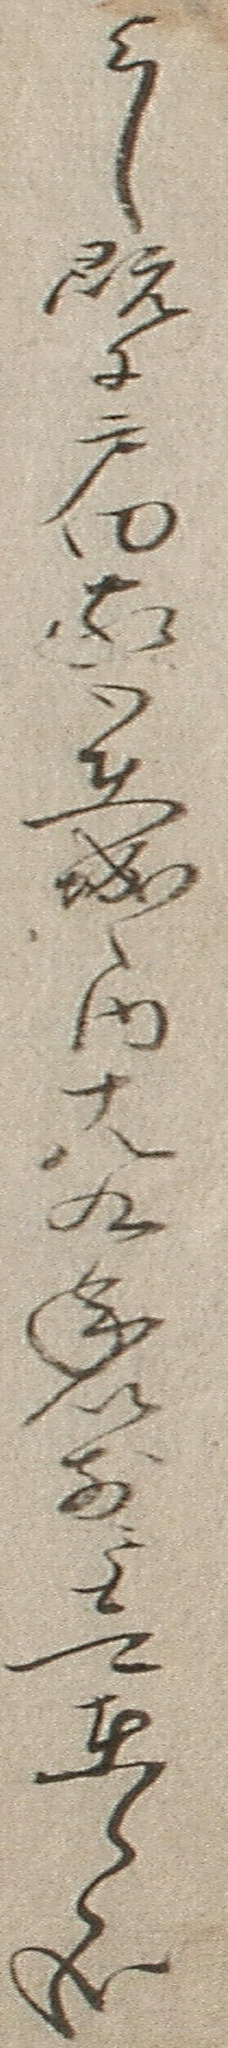よし既に戸田家御在城之内十八十九年以前にも可在候哉

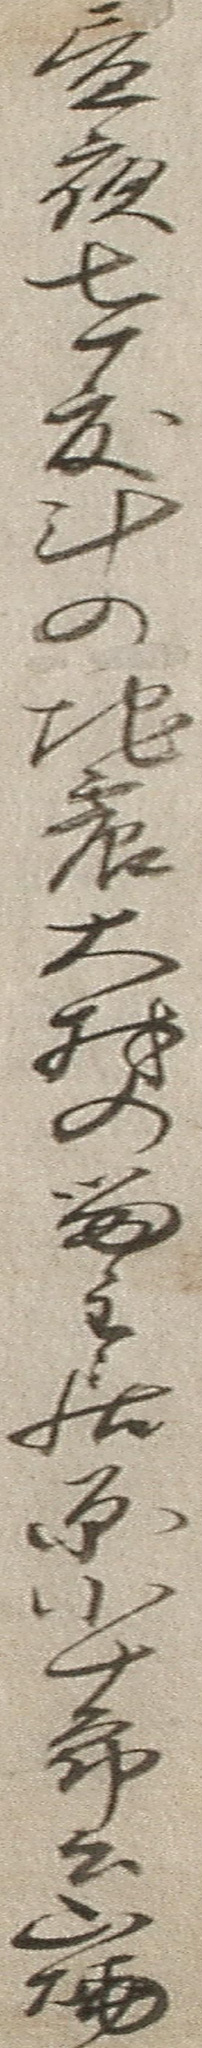昼夜七十度斗の地震大村の留守居原小十郎云山焼
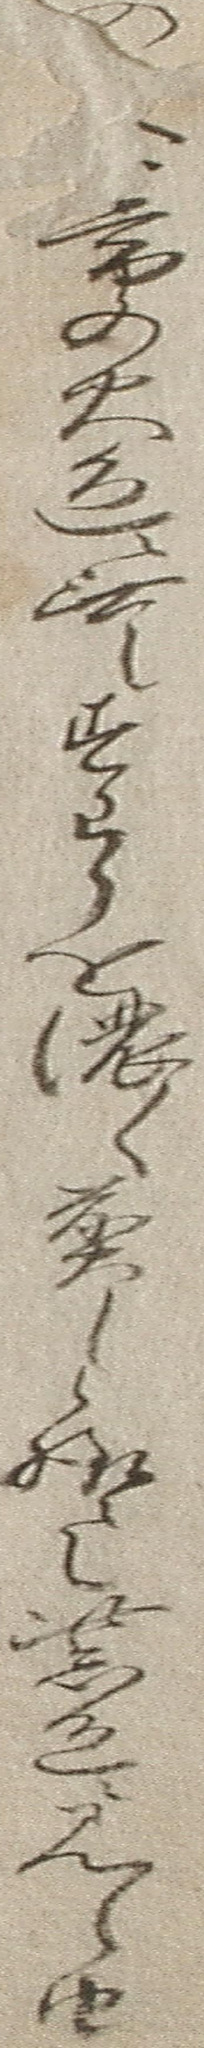の常の火色に無之すわりを濃く煎し候様にて紫色に見候由
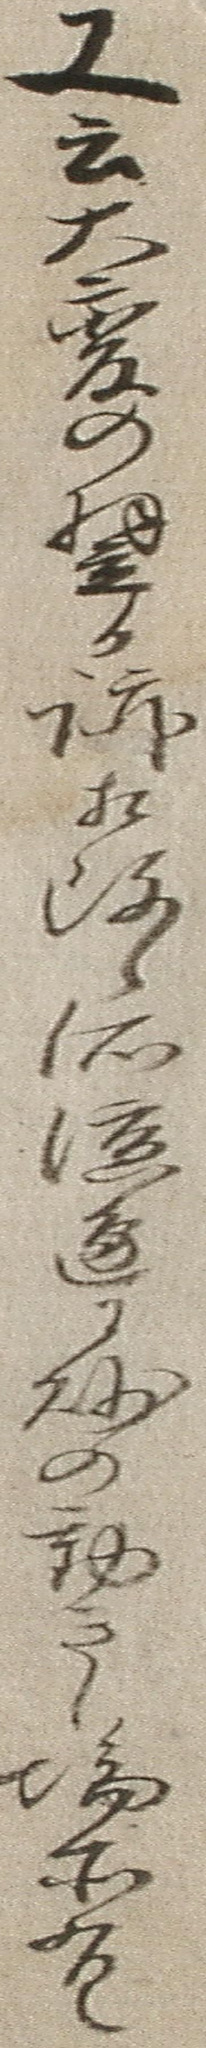又云大変の翌日跡相改候所浜辺に砂の動き候場所有之
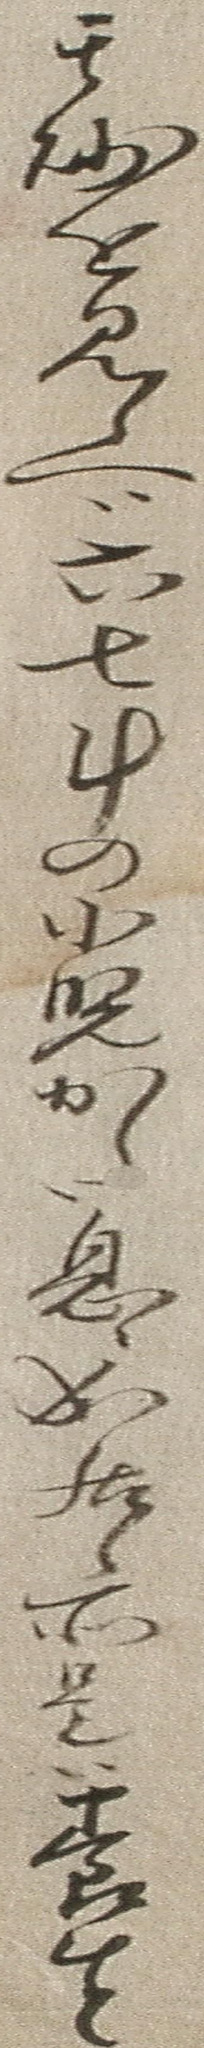其砂を見候へは六七斗の小児かた息に成居候所是は養生候
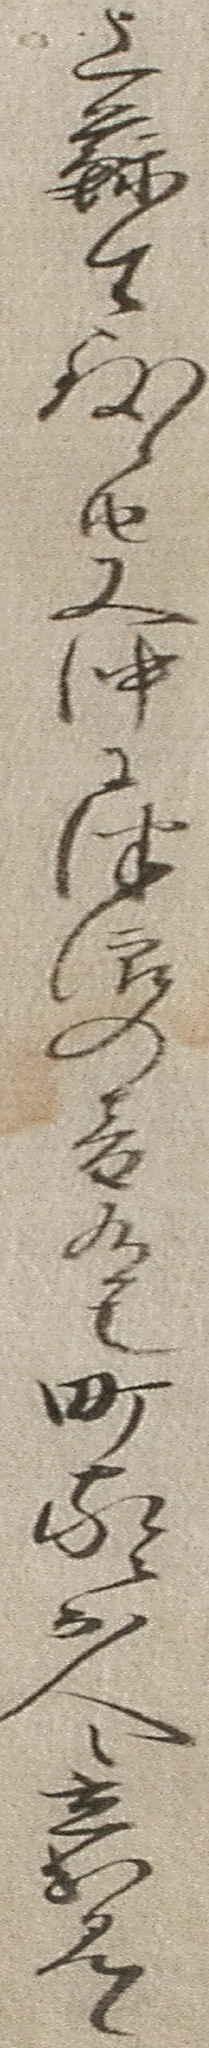上蘇生致候由又沖に津浪の音有之町家に而人々立出見候
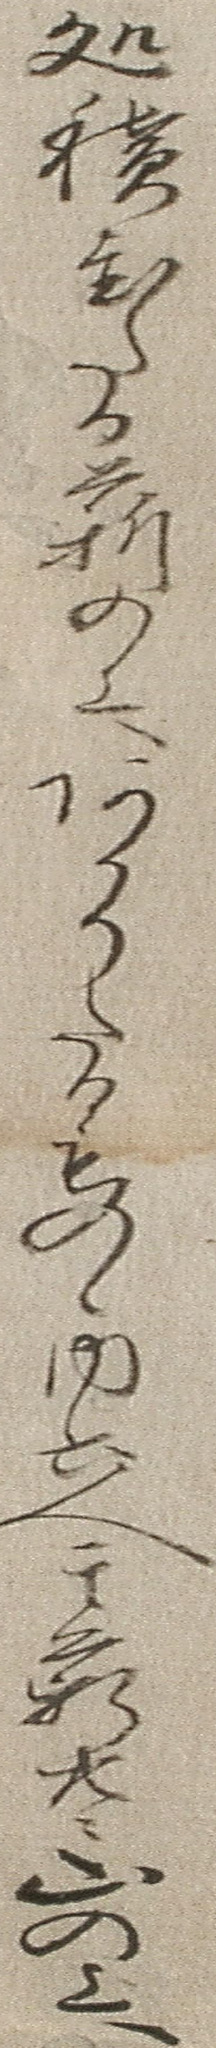処積置たる薪の上へあかりたるものゝ内六人其薪共山の上へ
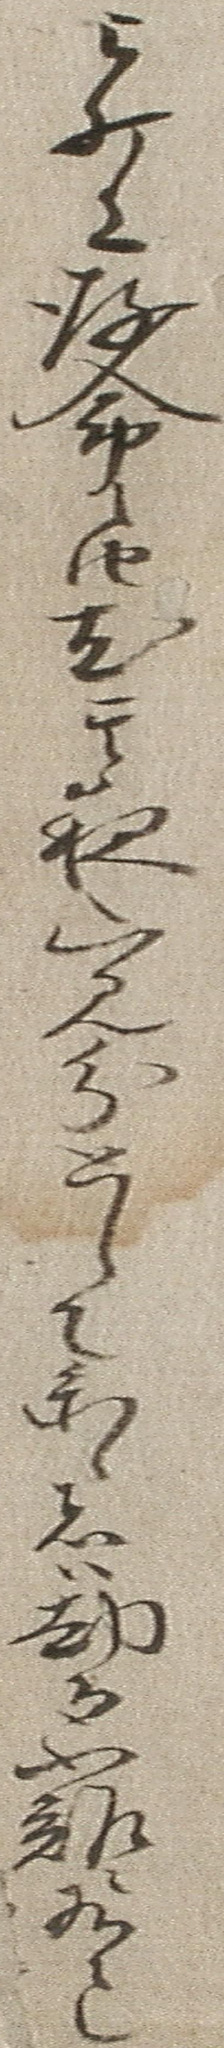被打上存命候由尤其夜山見分として参候者却而不難に有之候
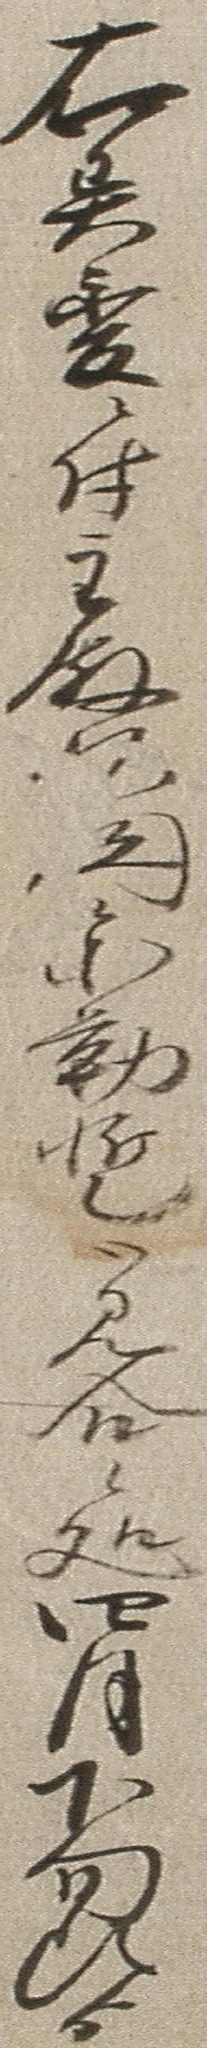一右異変に付主殿頭参勤暫御見合候処四月下旬頃ゟ
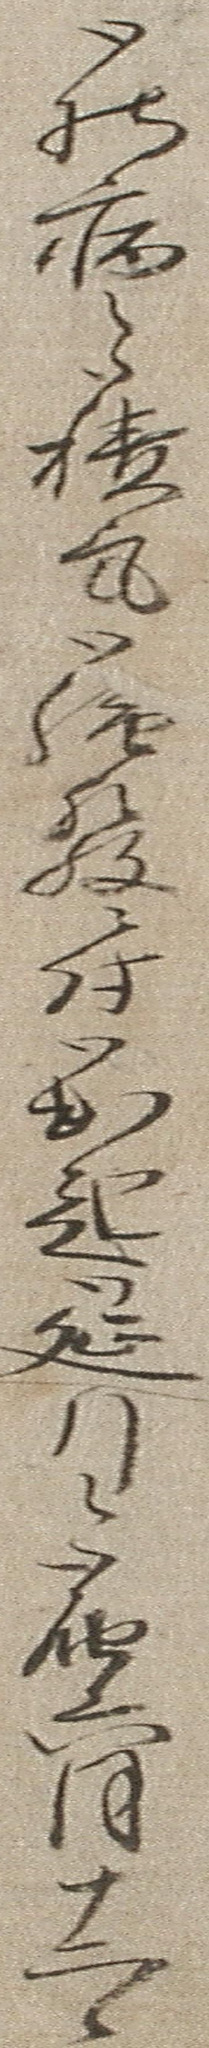御持病の御積気御強発に付御出起御延引に御座候六月十二日
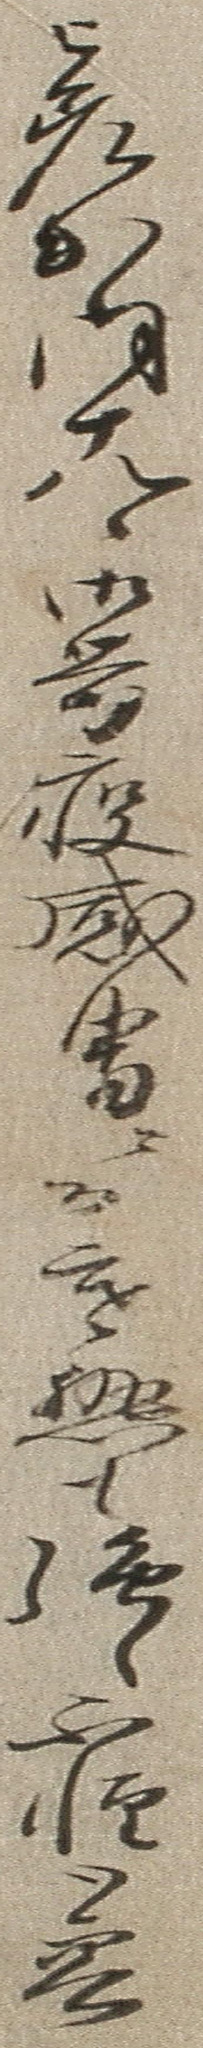被差出候同十八日御奇疫感冒に而寒熱も強く不軽御容
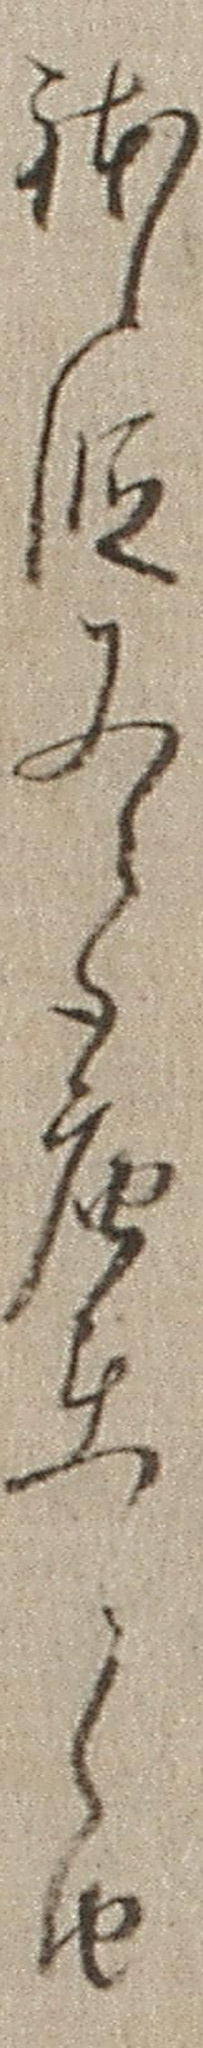体候段又々御届在之候由
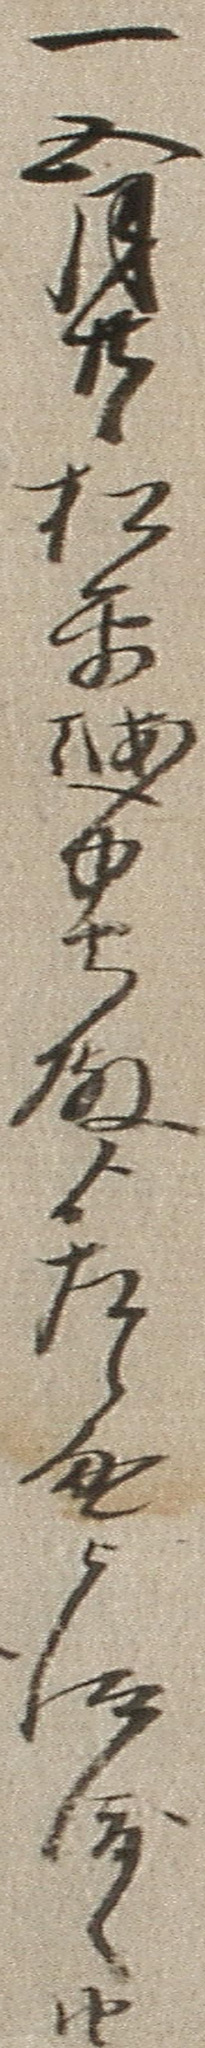一五月廿日松平越中守殿ゟ左之通被仰渡候由
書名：太平秘録抜書　浅間山燒及普賢山崩
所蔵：東京大学地震研究所図書室 Earthquake Research Institute Library, The University of Tokyo, JAPAN
